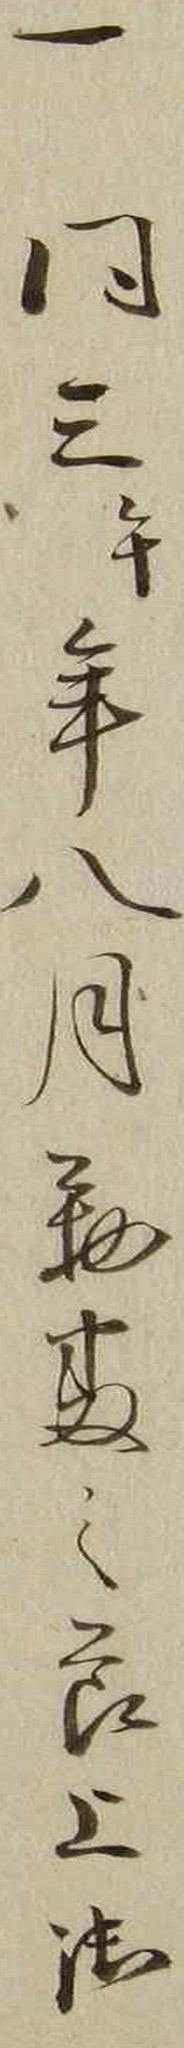一同三午年八月勤番之節上御
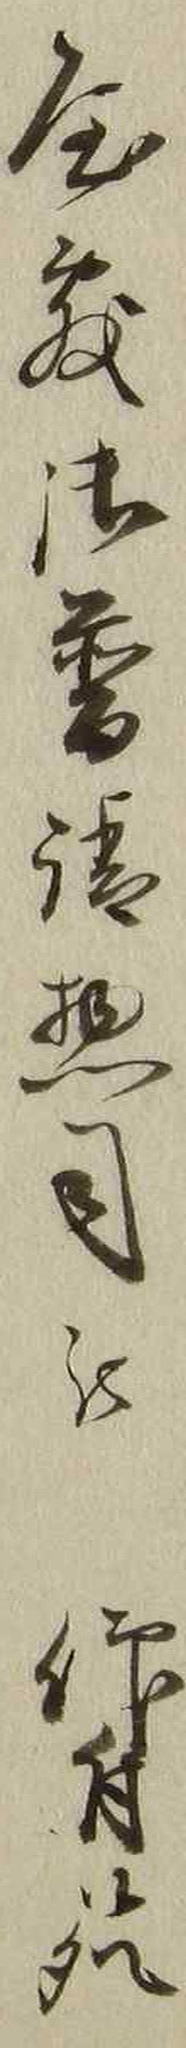屋敷御普請惣司被仰付候処
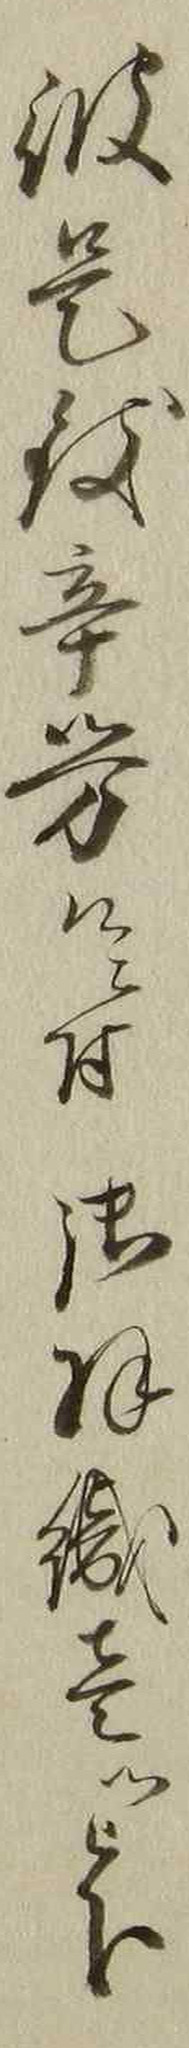彼是致辛労候に付御羽織壱つ被下
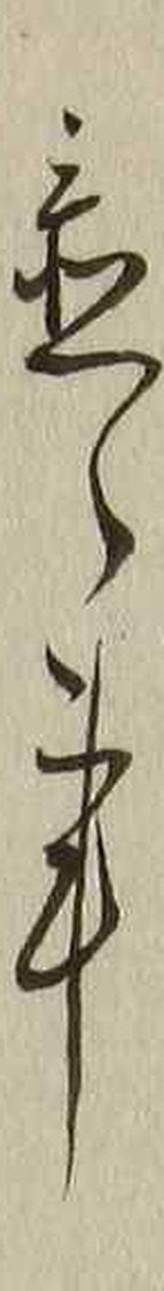置候事
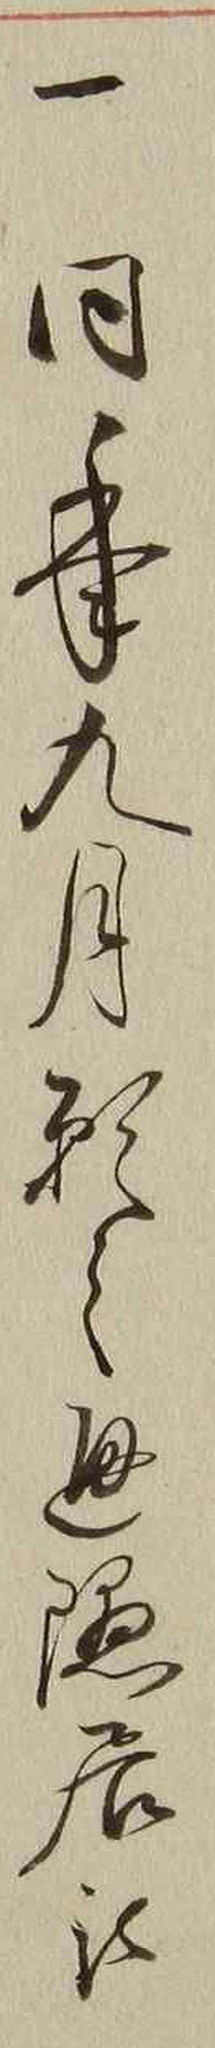一同年九月願之通隠居被
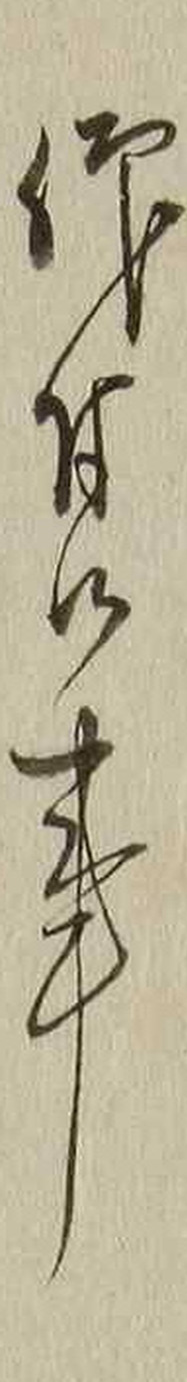仰付候事
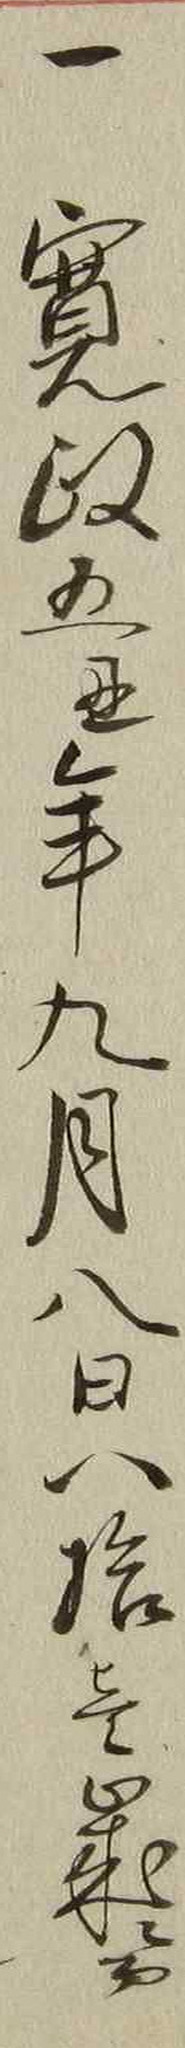一寛政五丑年九月八日八拾壱歳に而
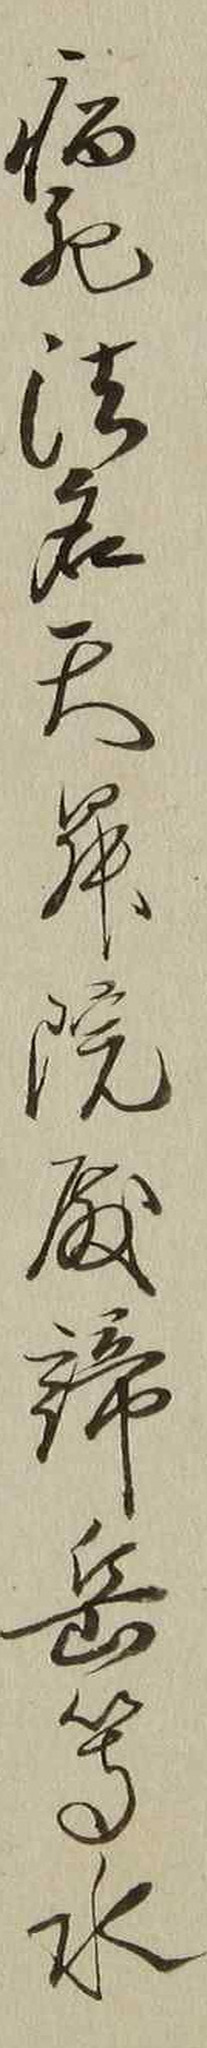病死法名天昇院殿諦岳等水
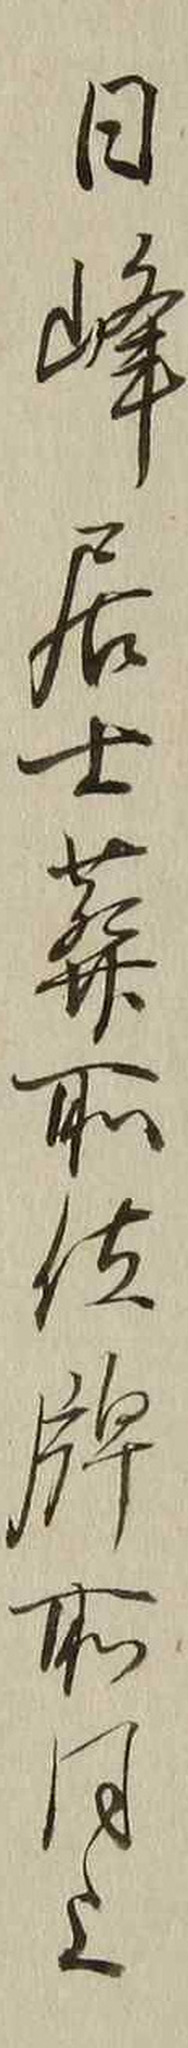日峰居士葬所位牌所同上
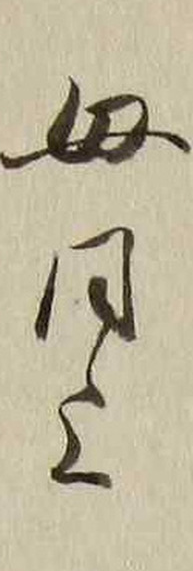母同上
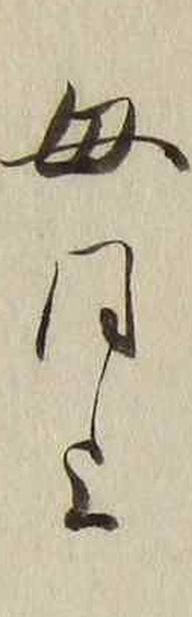母同上

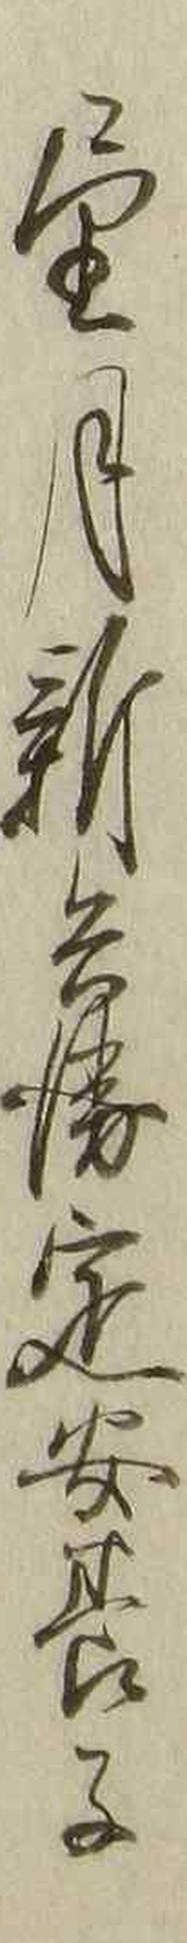望月新兵衛定安養子
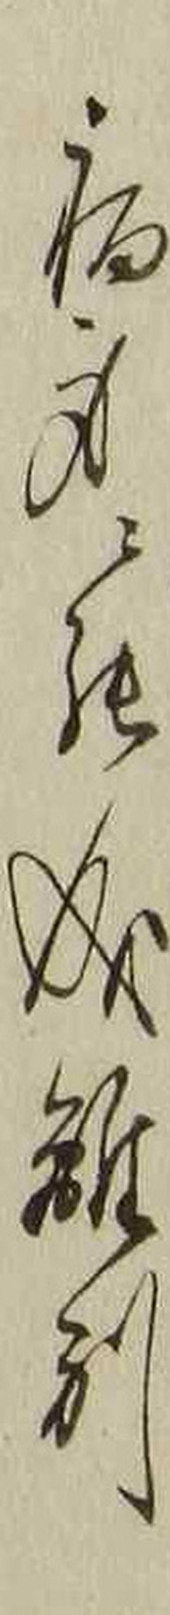病身に罷成離別
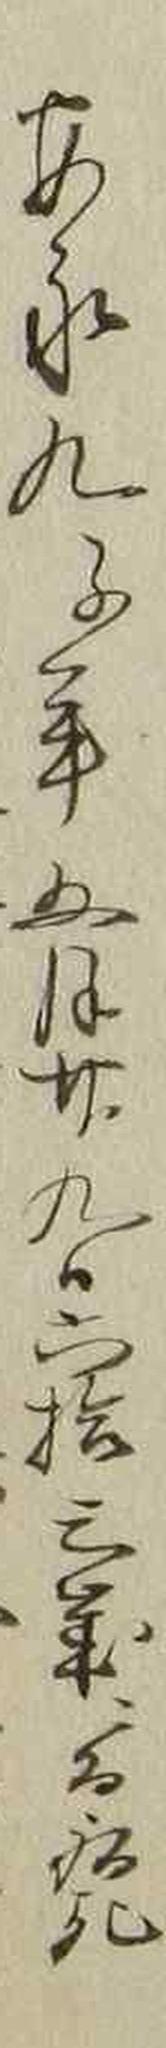安永九子年五月廿九日六拾三歳に而病死
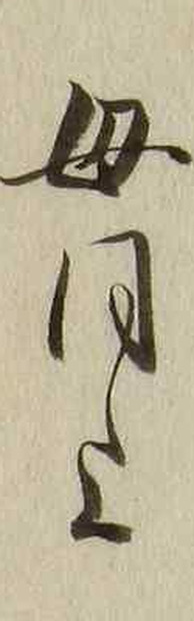母同上
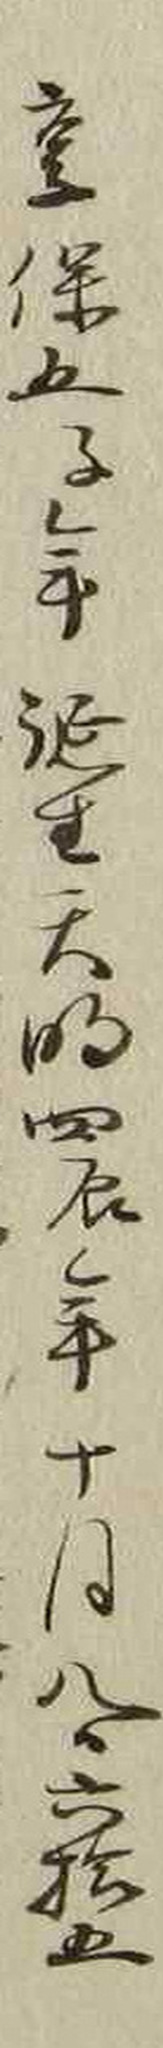享保五子年誕生天明四辰年十月八日六拾五
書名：諸士系譜　巻之103　か之部11
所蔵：会津若松市立会津図書館
